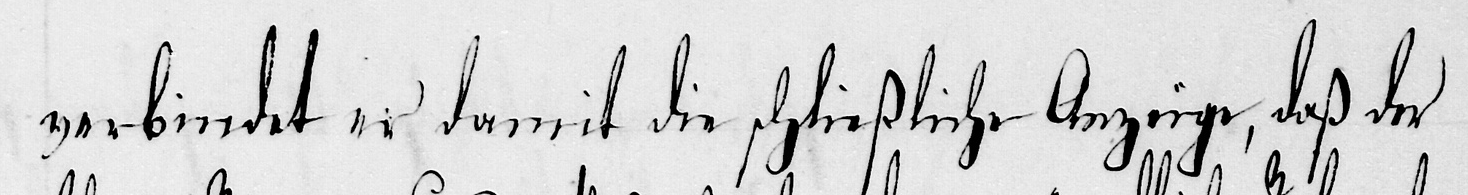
verbindet er damit die schließliche Anzeige, daß der
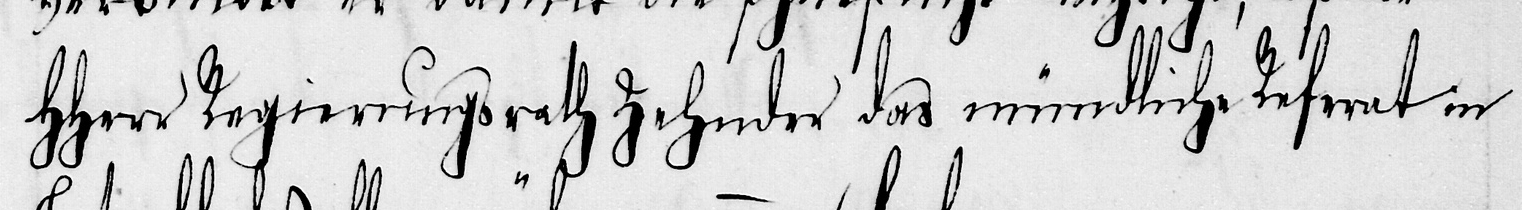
Herr Regierungsrath Zehnder das mündliche Referat in
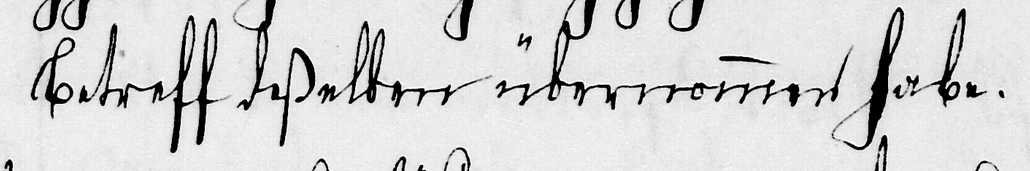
Betreff deßelben übernommen habe.
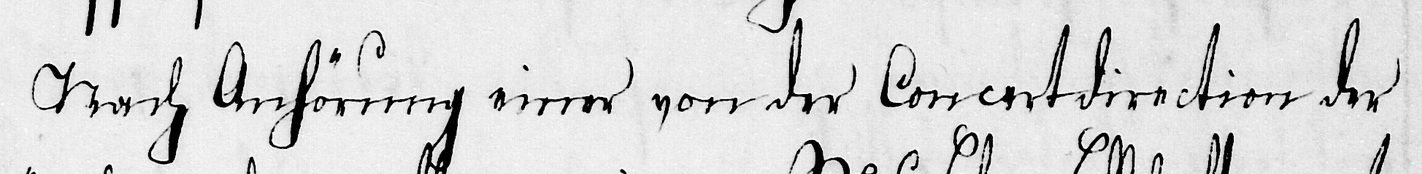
Nach Anhörung einer von der Concertdirection der
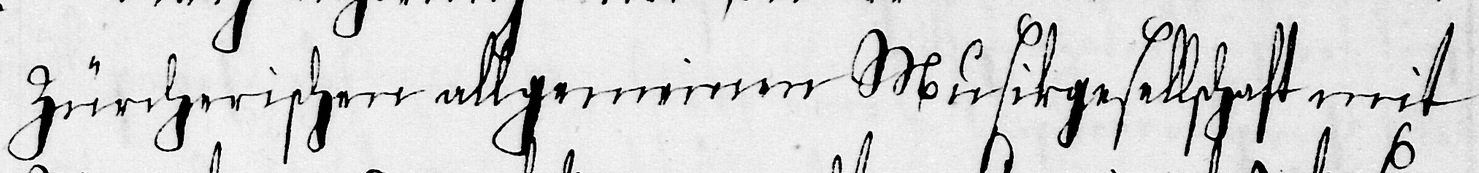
Zürcherischen allgemeinen Musikgesellschaft mit
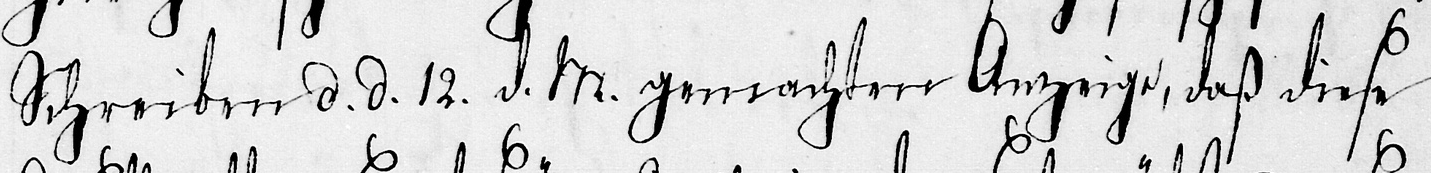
Schreiben d. d. 12. d. M. gemachten Anzeige, daß diese
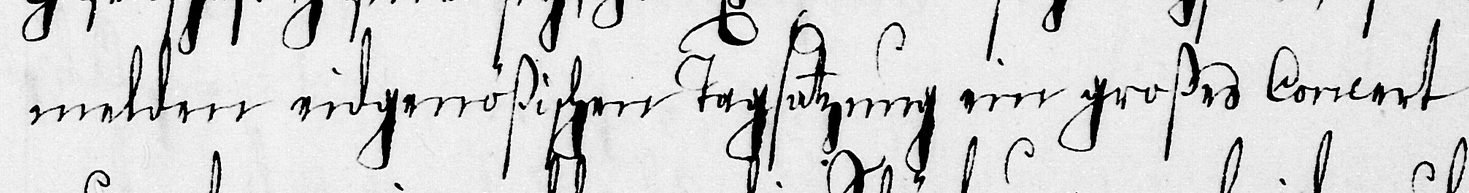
melden eidgenößischen Tagsatzung ein großes Concert
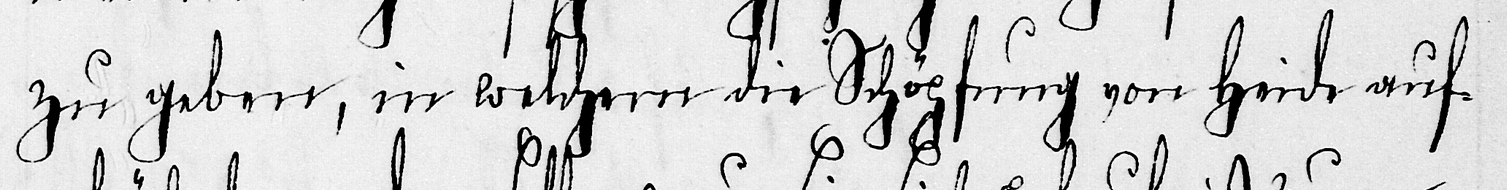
zu geben, in welchem die Schöpfung von Heide auf¬
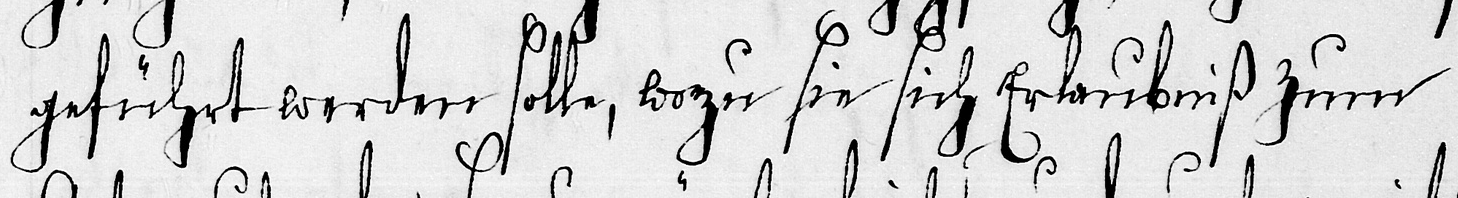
geführt werden solle, wozu sie sich Erlaubniß zum
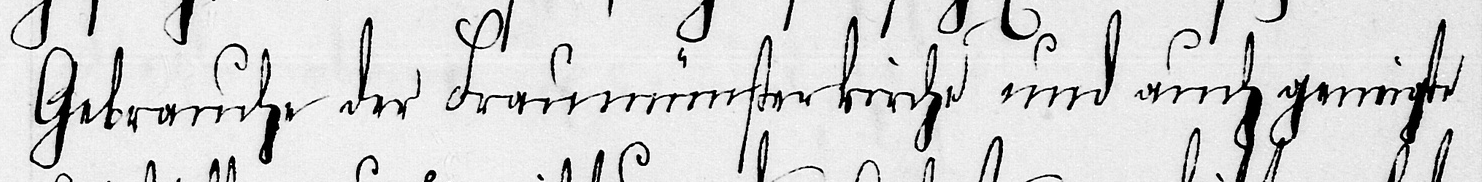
Gebrauche der Fraumünsterkirche und auch geneigte
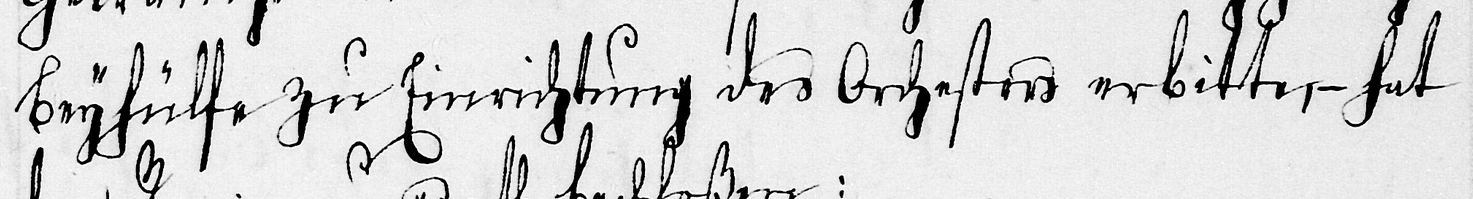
Beyhülfe zu Einrichtung des Orchesters erbitte, – hat
